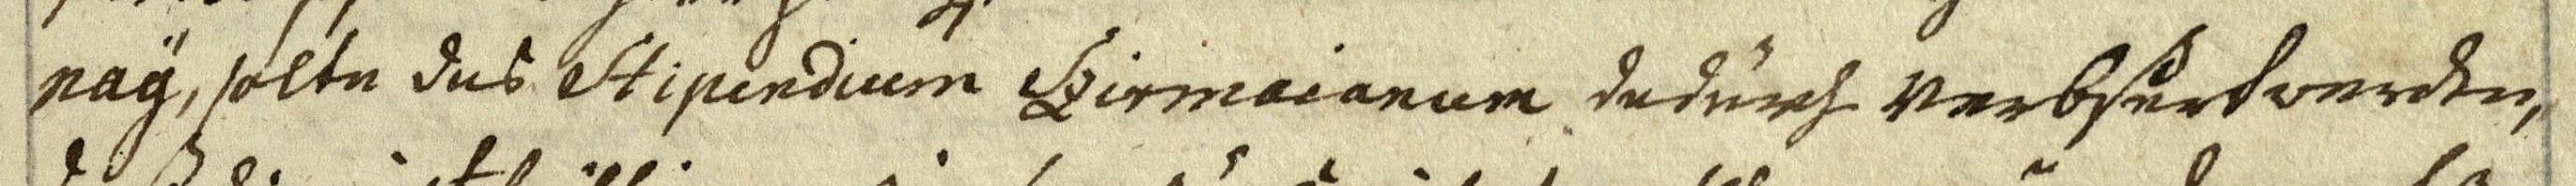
naÿ, solte das Stipendium Szirmaianum dadurch verbßert werden,
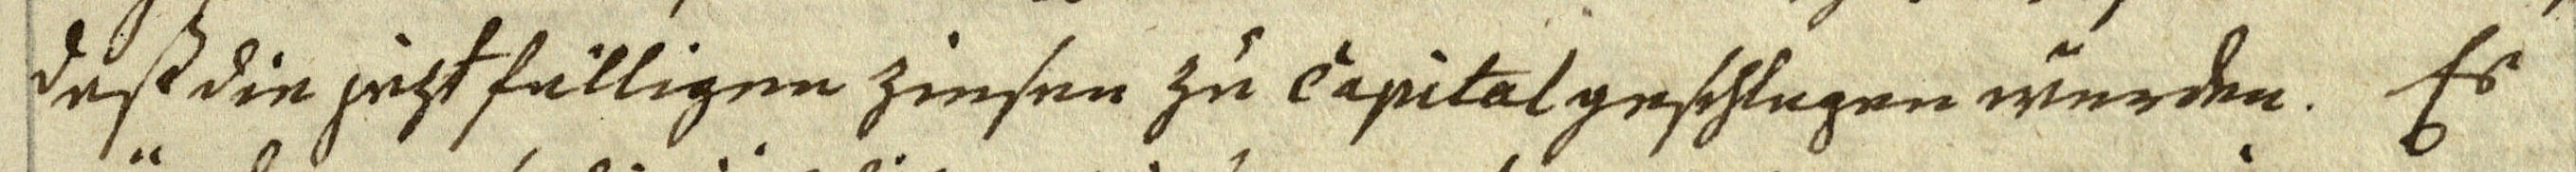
daß die jezt fälligen Zinsen zu Capital geschlagen würden. Es
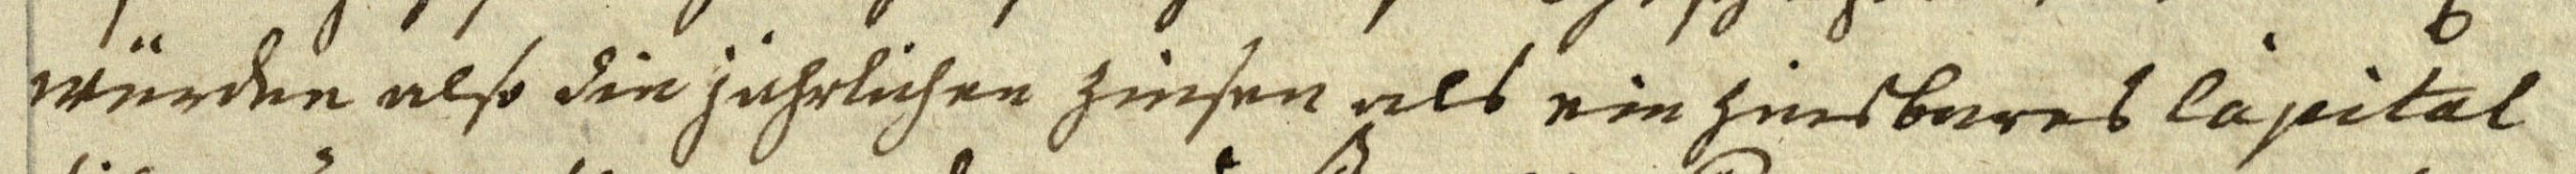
würden also die jährlichen Zinsen als ein zinsbares Capital
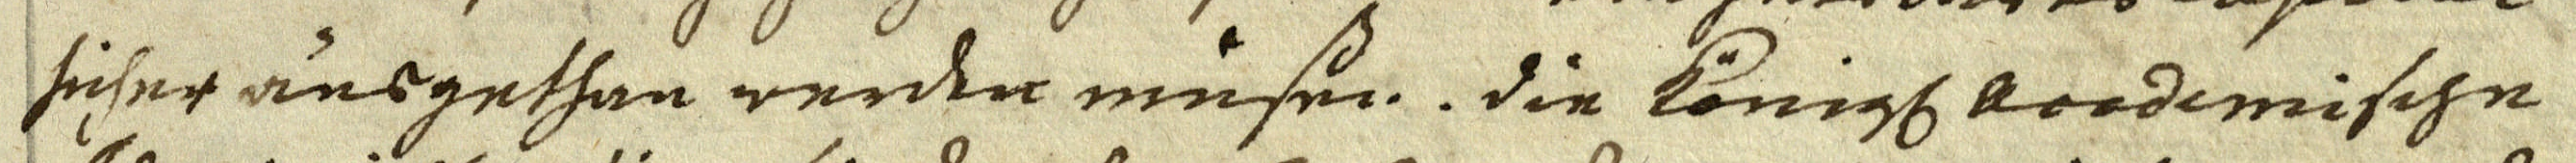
sicher ausgethan werden müßen. Die Königl. Academische
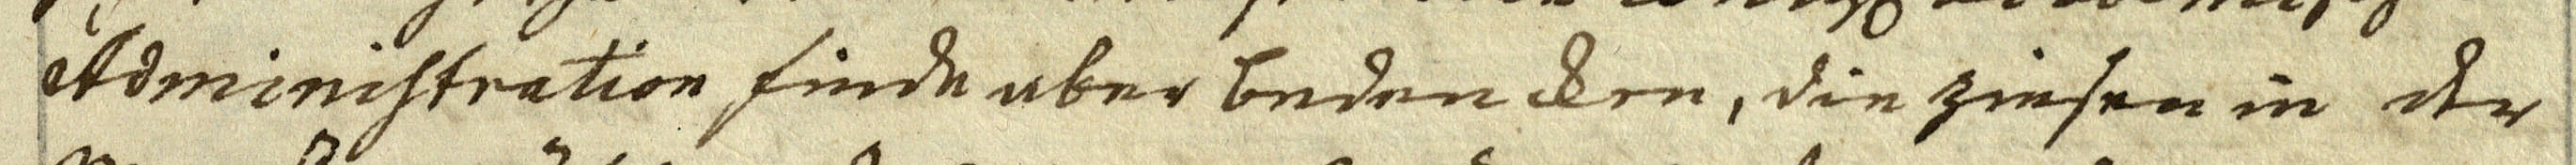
Administration finde aber Bedencken, die Zinsen in der
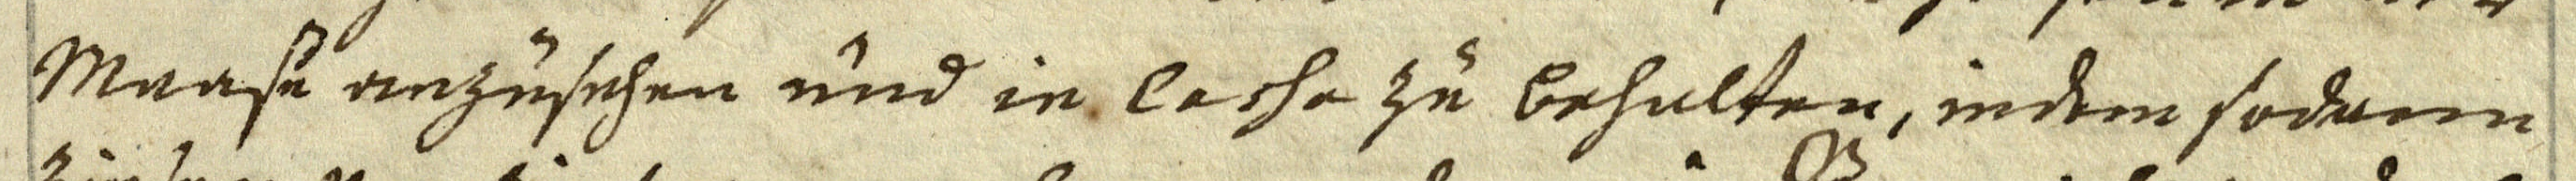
Maaße anzusehen und in cassa zu behalten, indem sodann
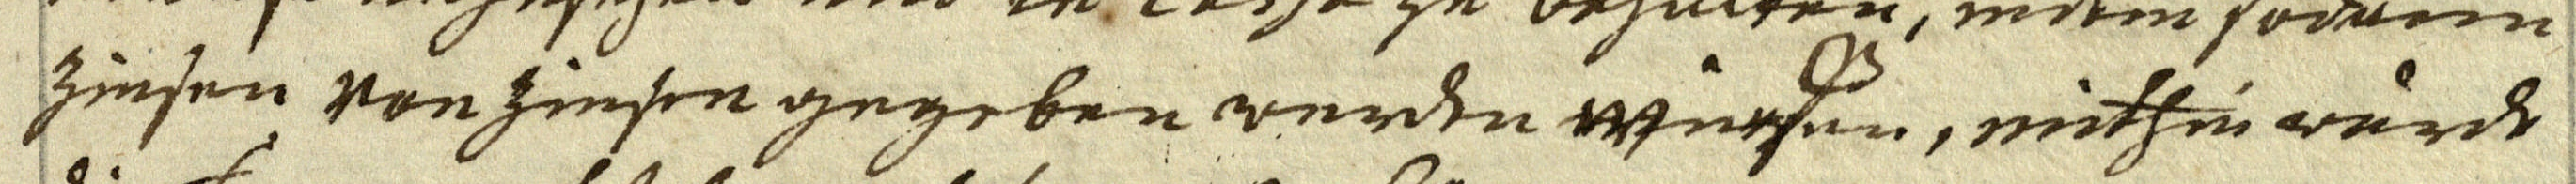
Zinsen von Zinsen gegeben werden würden, mithin würde
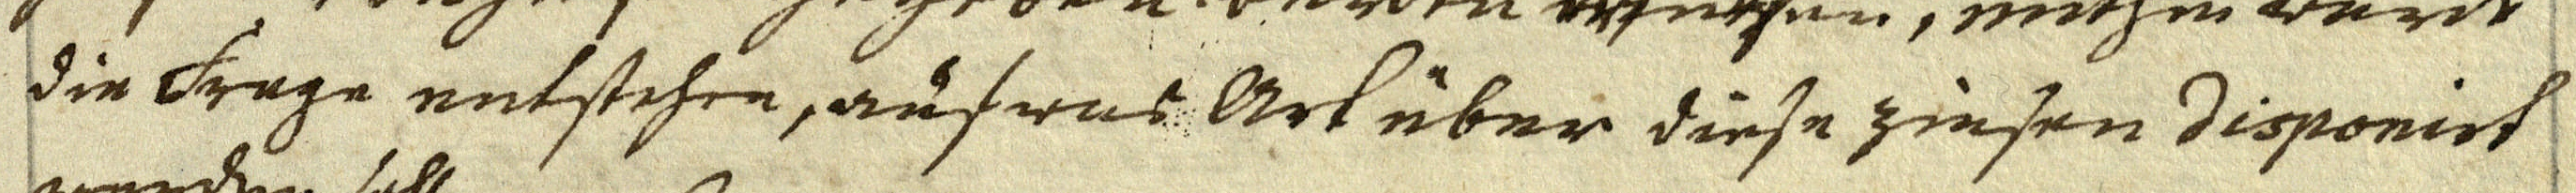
die Frage entstehen, auf was Art über diese Zinsen disponirt
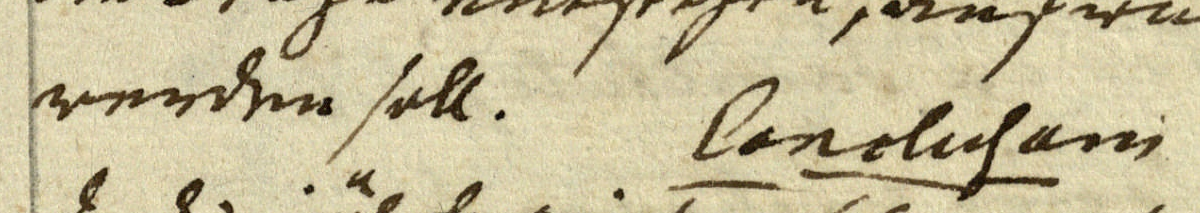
werden soll. Conclusum
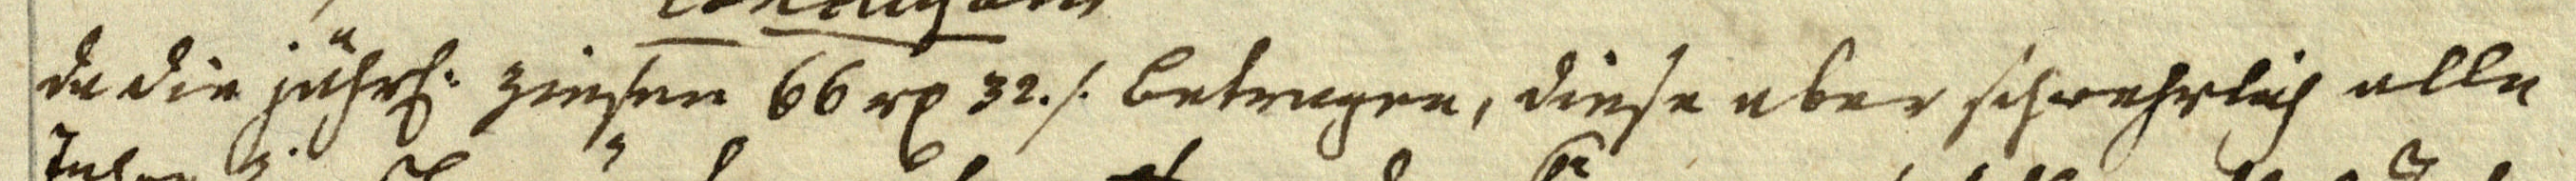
Da die jährl. Zinsen 66 r. 32 s. betragen, diese aber schwehrlich alle
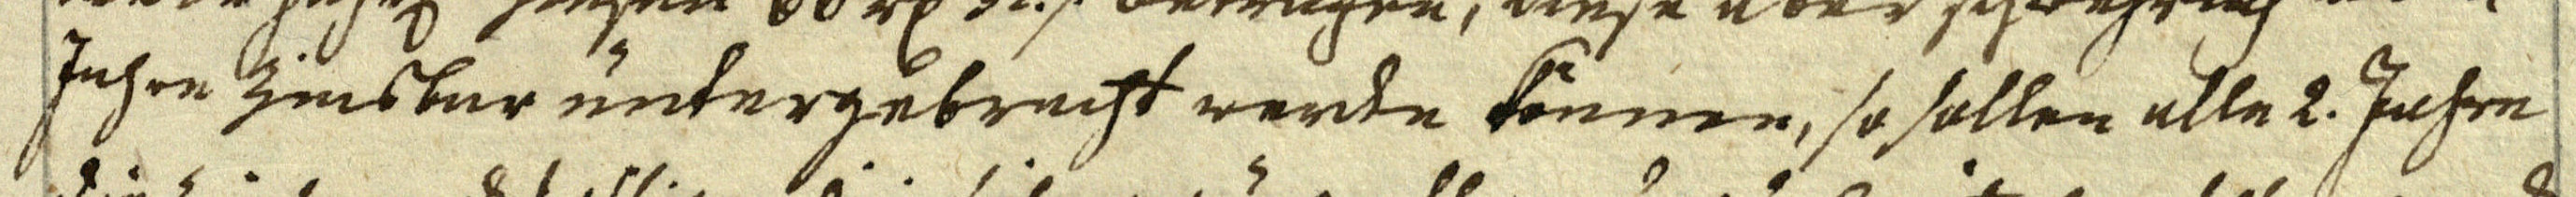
Jahre zinsbar untergebracht werden können, so sollen alle 2. Jahre
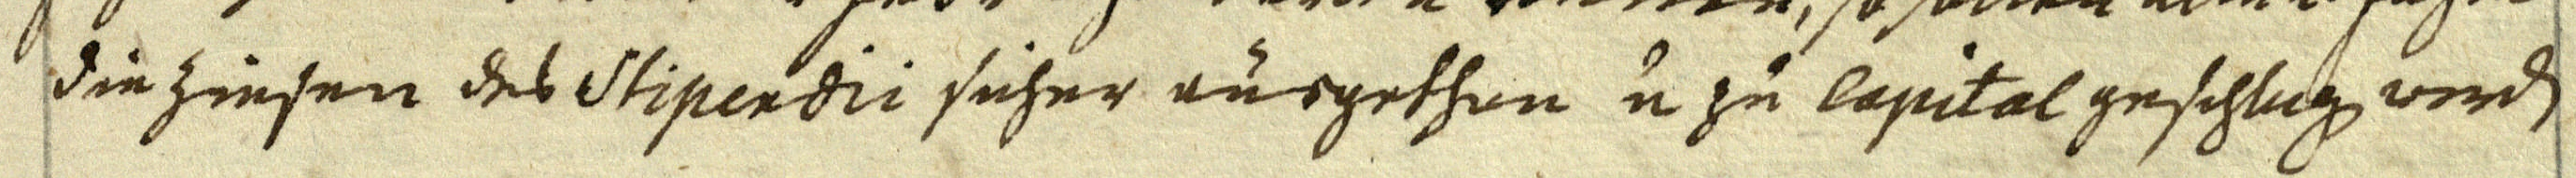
die Zinsen des Stipendii sicher ausgethan u zu Capital geschlag werde¬
